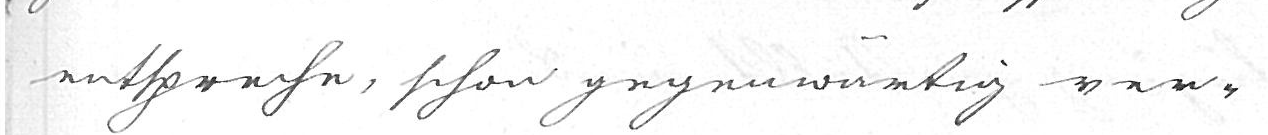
entspreche, schon gegenwärtig ver-
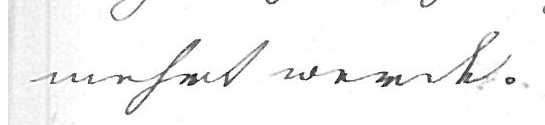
mehrt werde.
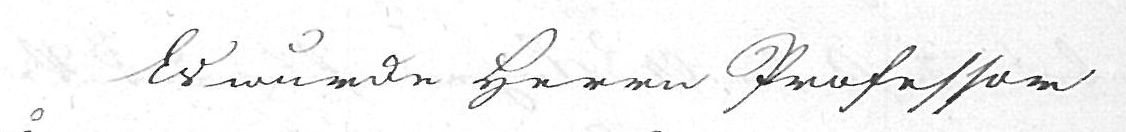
Es wurde Herrn Professor
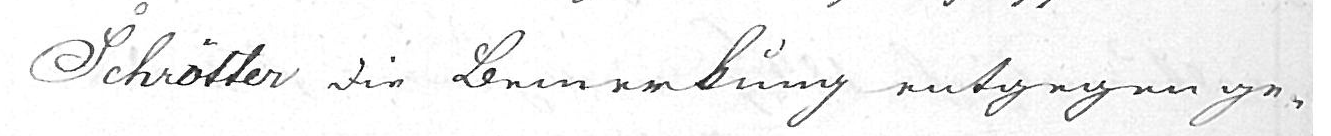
Schrötter die Bemerkung entgegen ge-
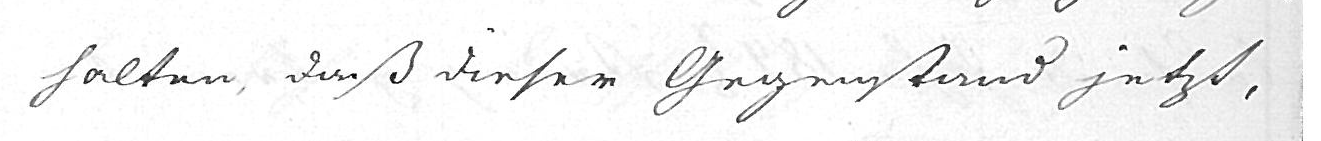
halten, daß dieser Gegenstand jetzt,
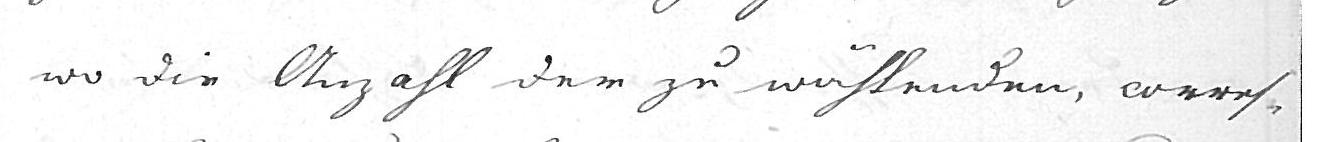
wo die Anzahl der zu wählenden, corres-
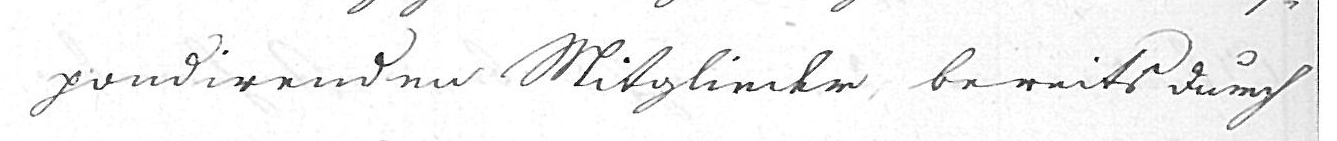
pondirenden Mitglieder bereits durch
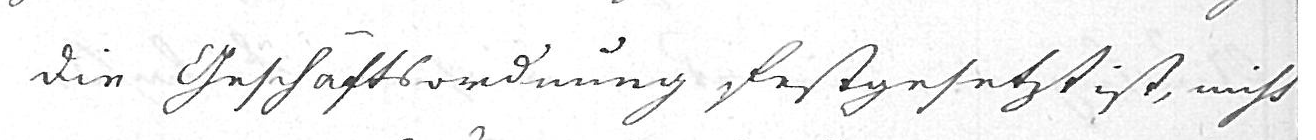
die Geschäftsordnung festgestezt ist, nicht
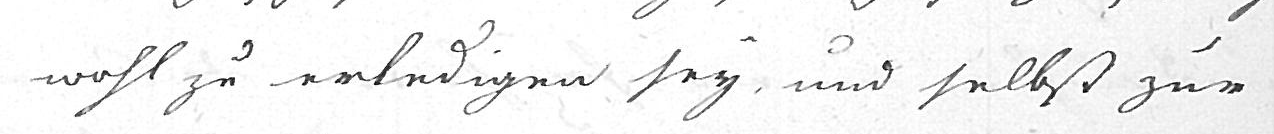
wohl zu erledigen sey und selbst zur
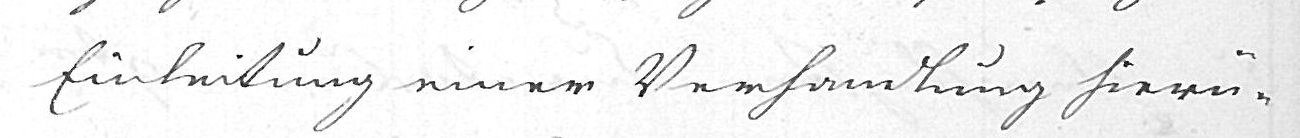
Enleitung einer Verhandlung hierü-
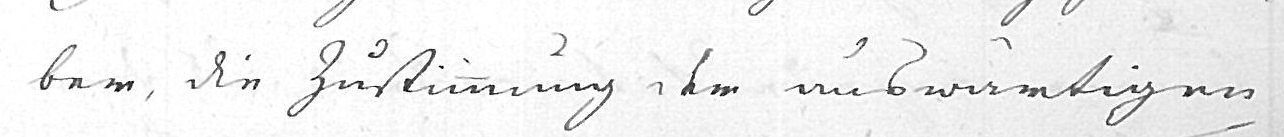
ber, die Zustimmung der auswärtigen
